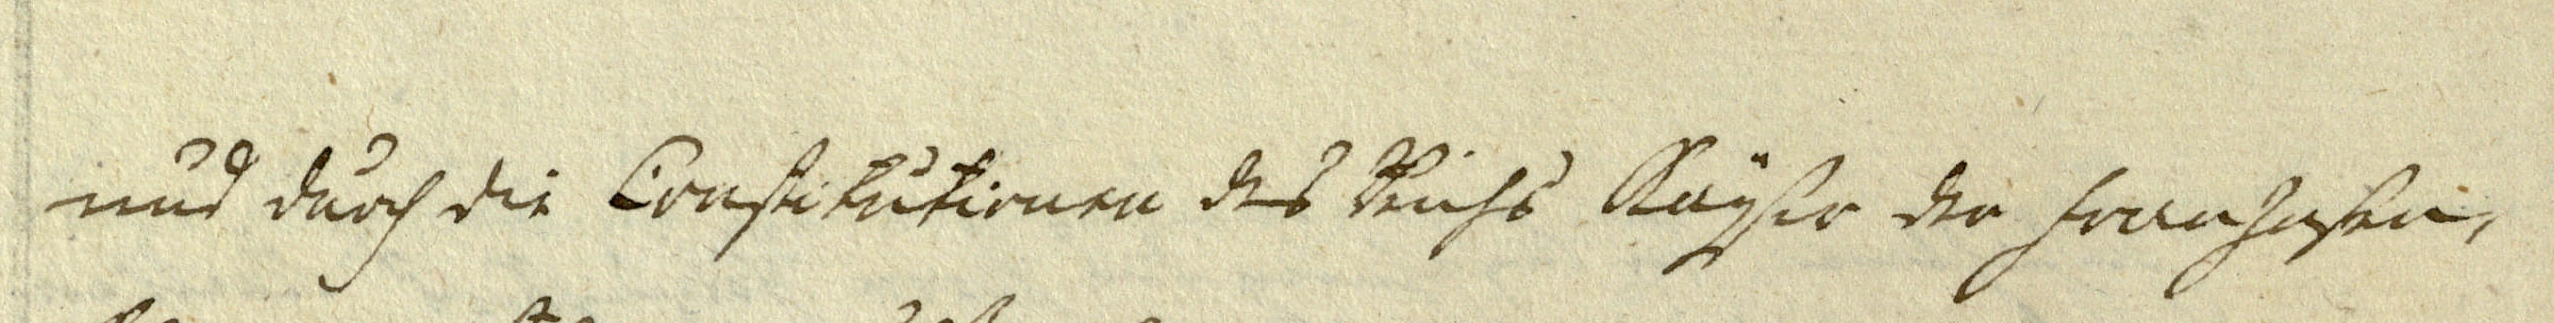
und durch die Constitutionen des Reichs Kaÿser der Franzosen,
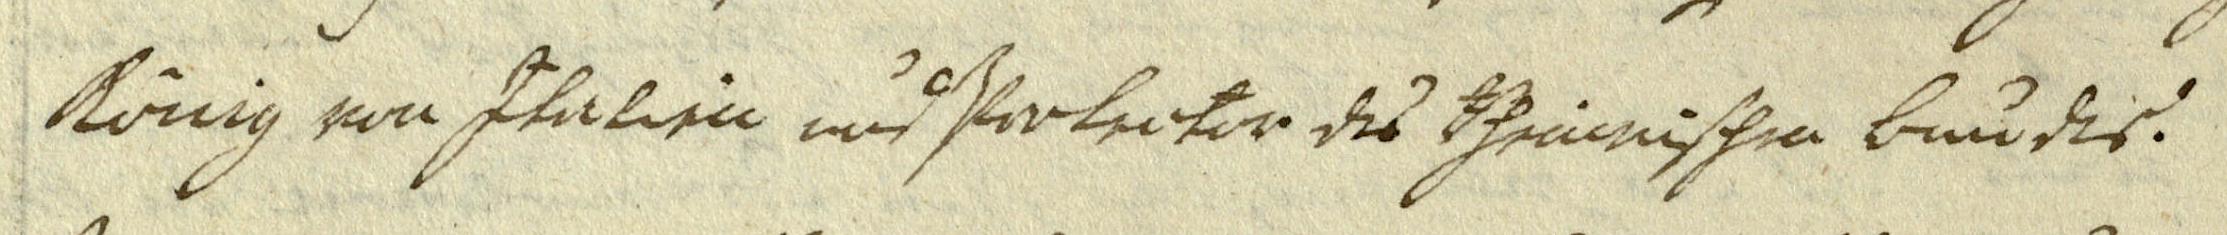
König von Italien und Protector des Rheinischen Bundes.
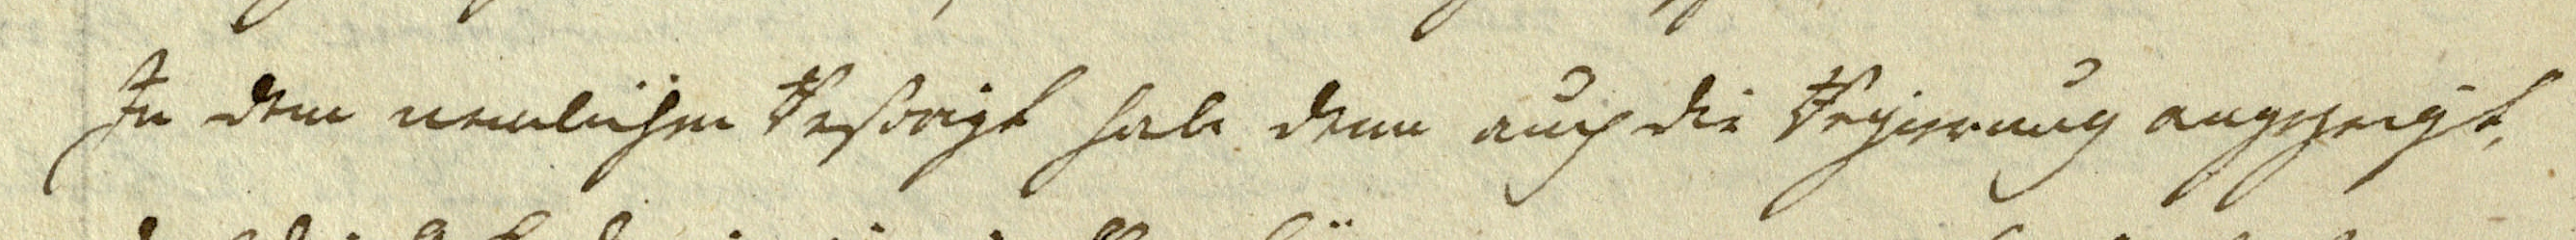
In dem nemlichen Rescript habe denn auch die Regierung angezeigt,
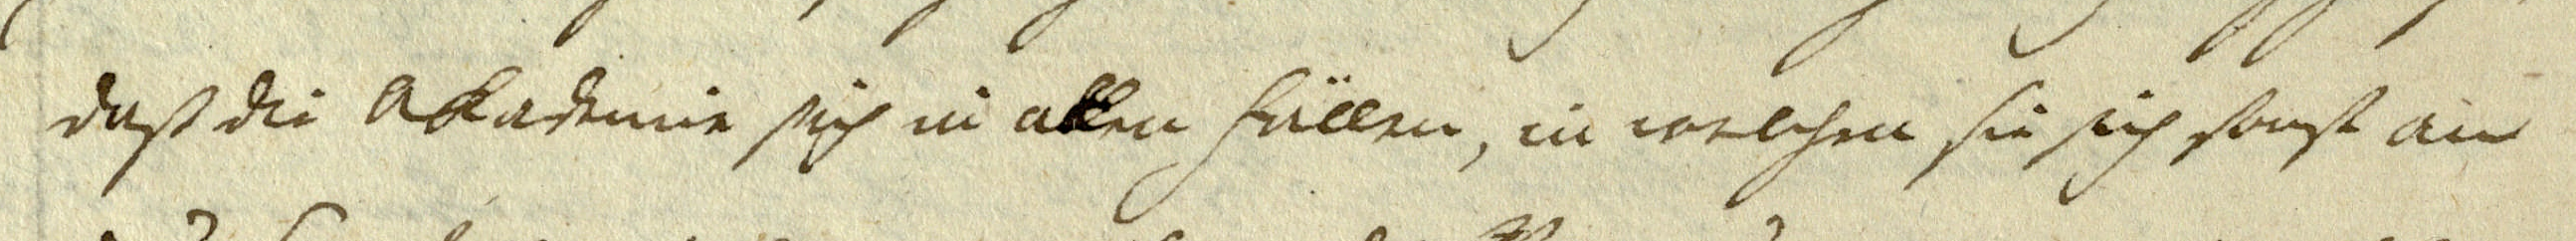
daß die Akademie sich in allen Fällen, in welchen sie sich sonst an
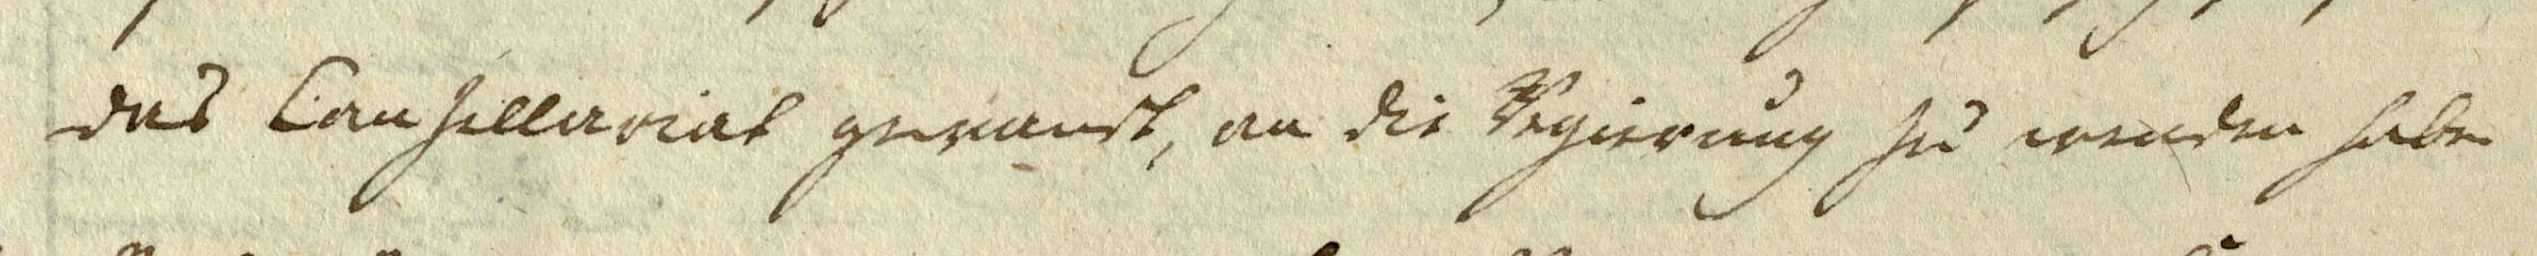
das Canzellariat gewandt, an die Regierung zu wenden habe.
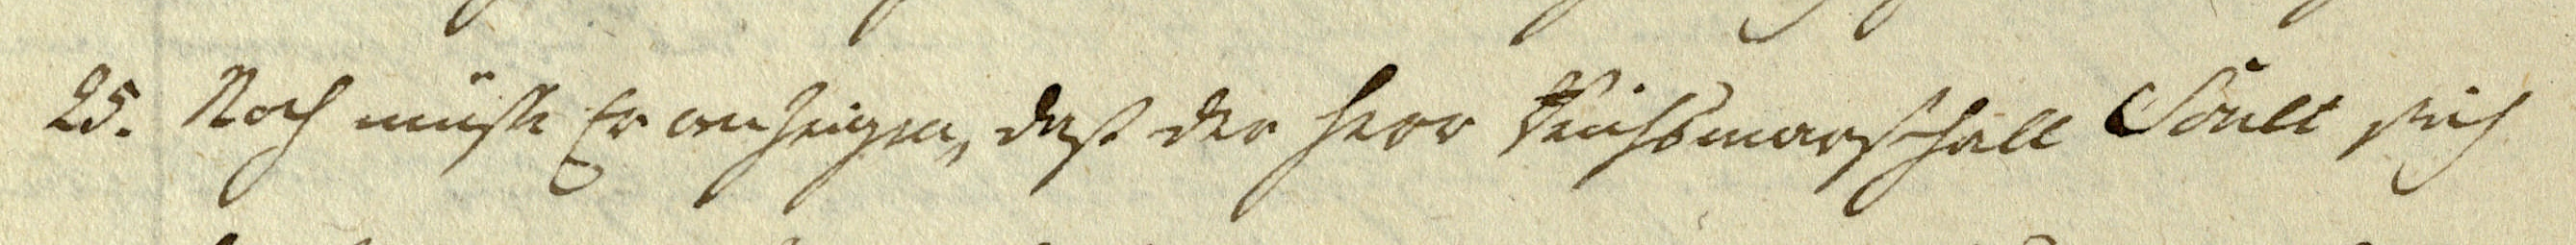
25. Noch müsse Er anzeigen, daß der Herr Reichsmarschall Soult sich
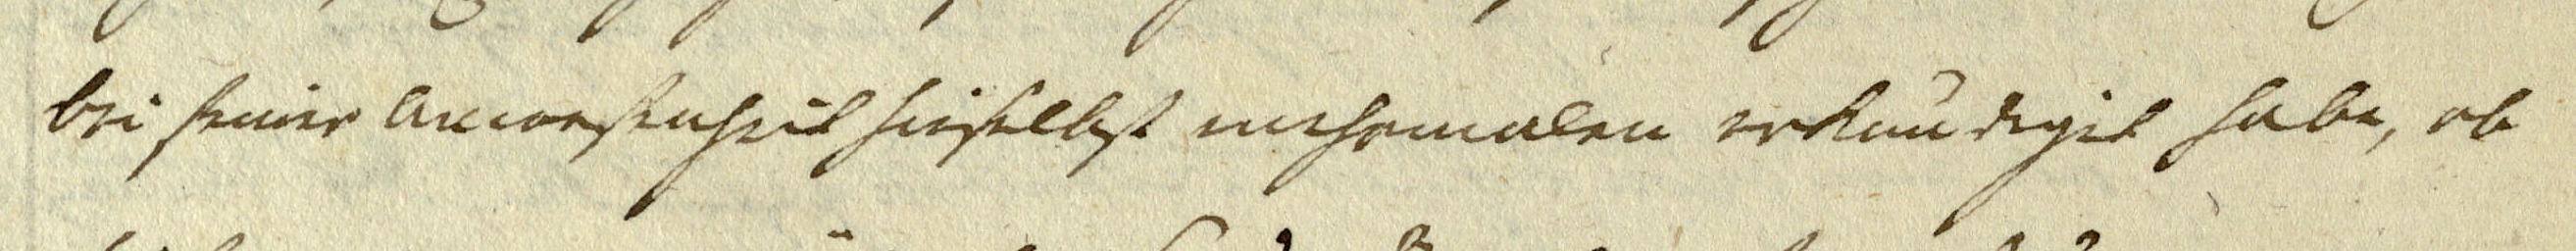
bei seiner Anwesenheit hieselbst mehrmalen erkundiget habe, ob
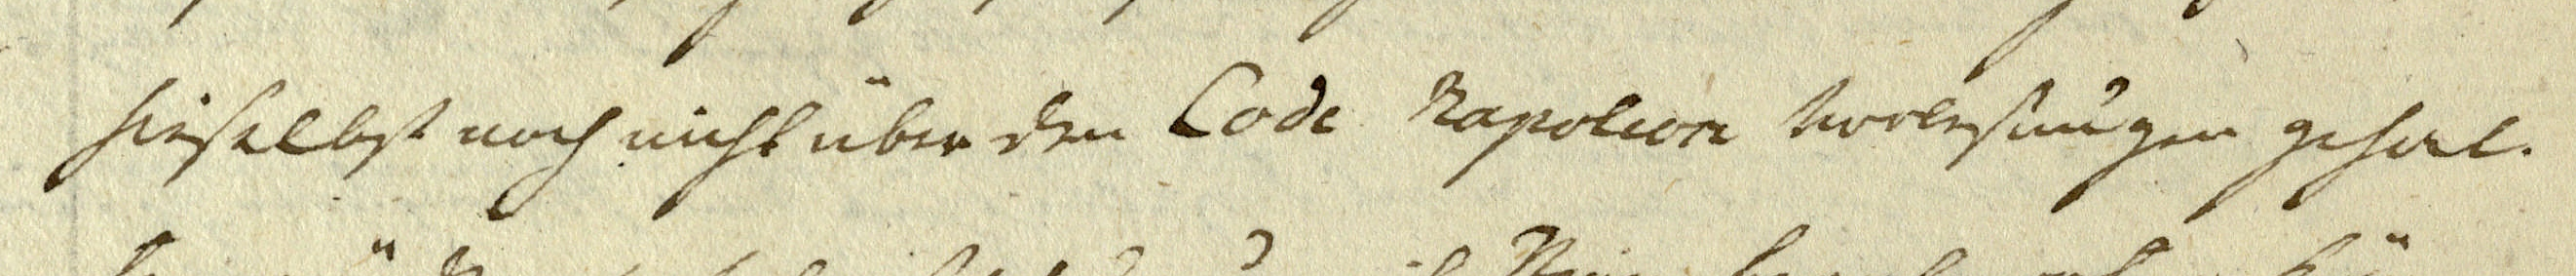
hieselbst noch nicht über den Code Napoleon Vorlesungen gehal¬
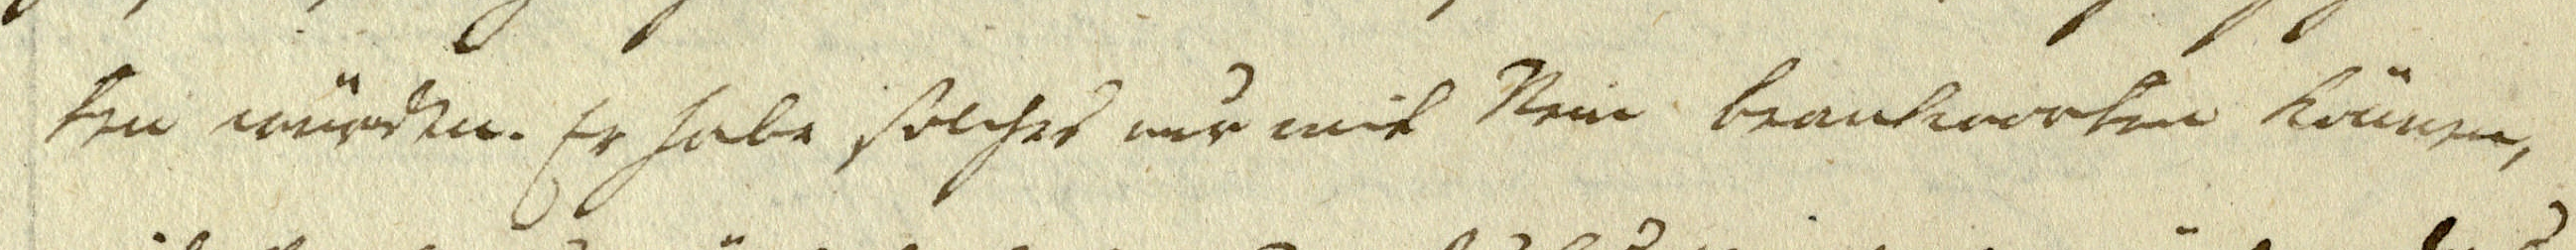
ten würden. Er habe solches nur mit Nein beantworten können,
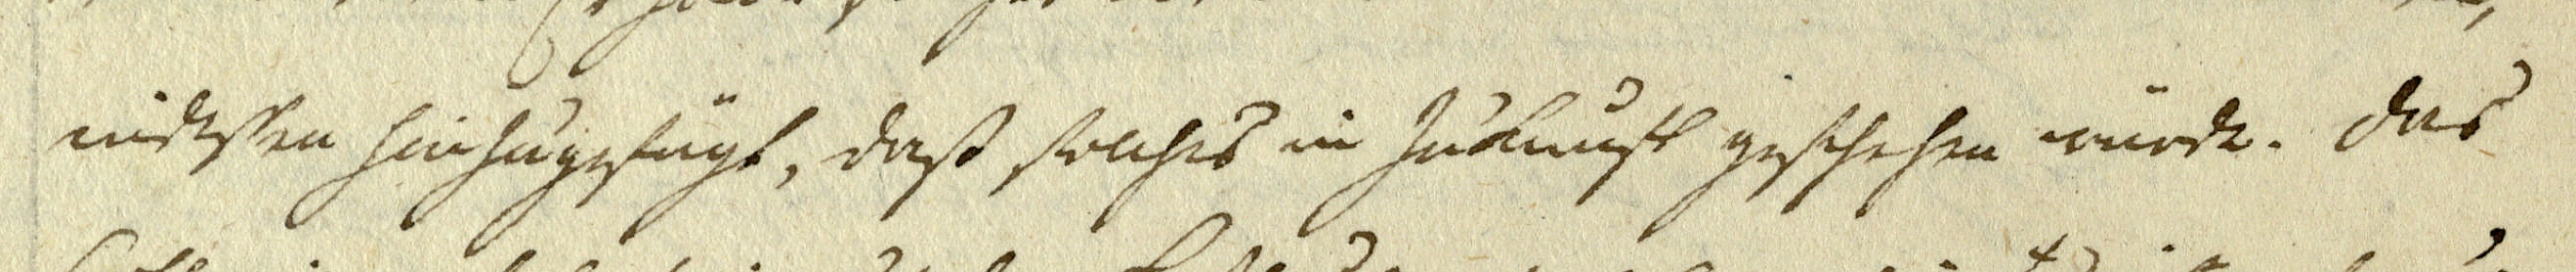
indessen hinzugefügt, daß solches in Zukunft geschehen würde. Das
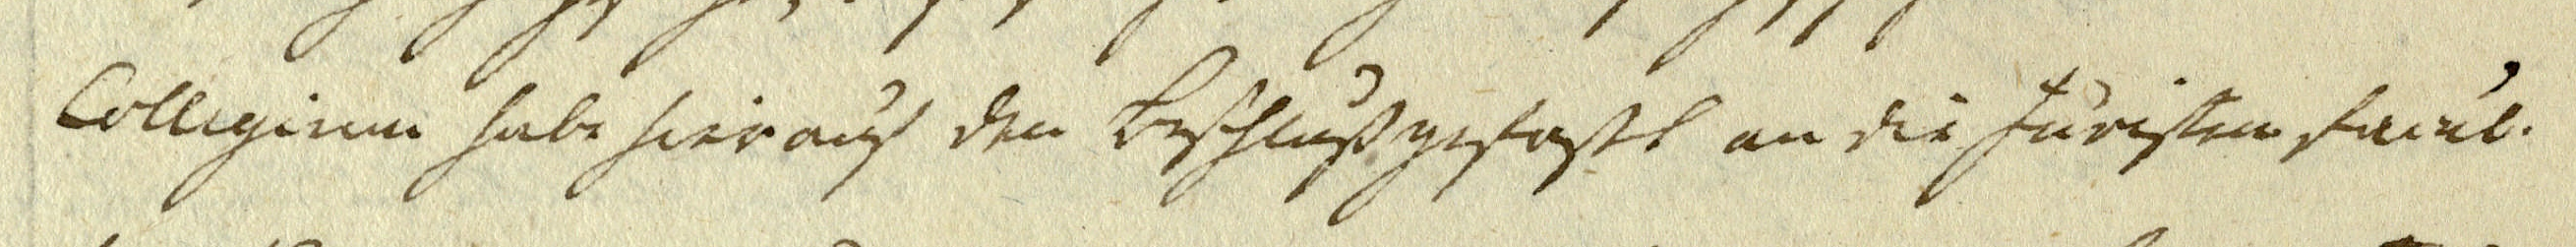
Collegium habe hierauf den Beschluß gefaßt an die Juristenfacul¬
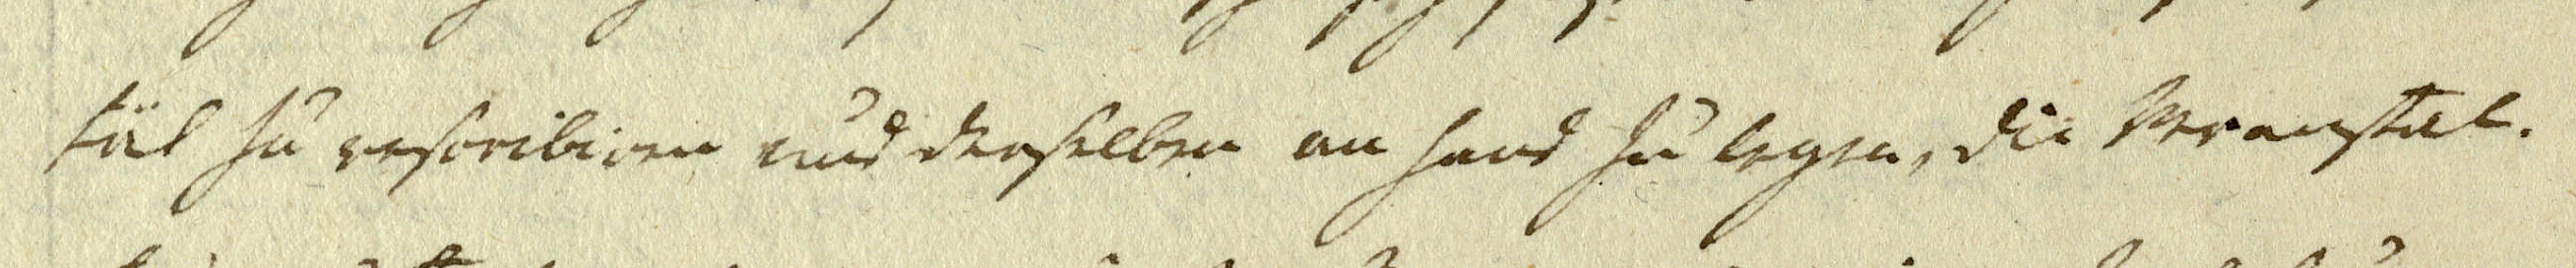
tät zu rescribiren und derselben an Hand zu legen, die Veranstal¬
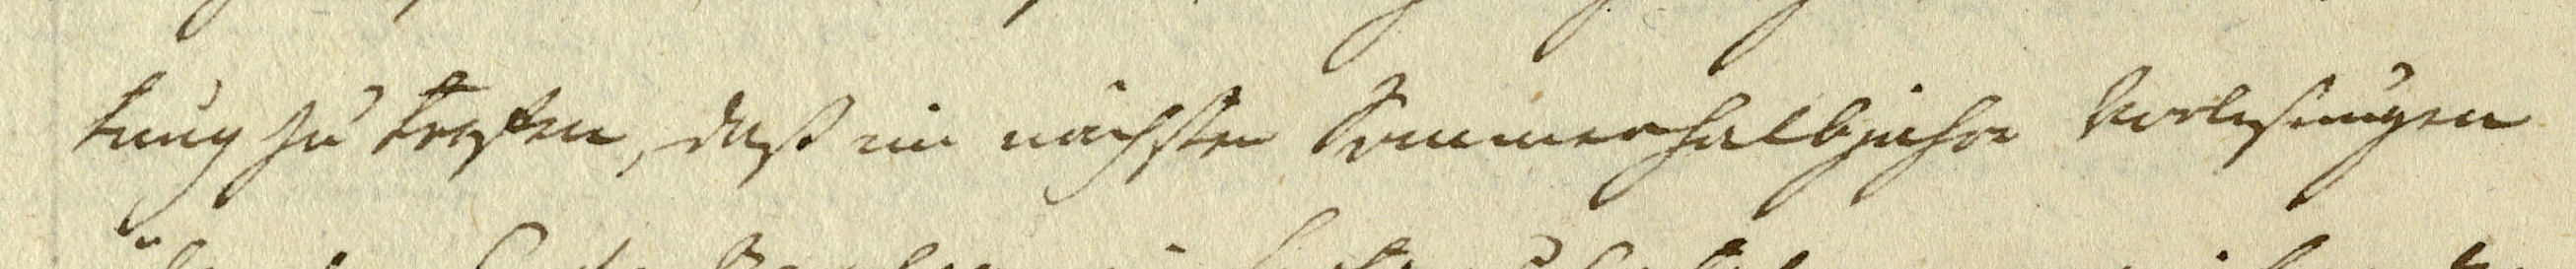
tung zu trefen, daß im nächsten Sommerhalbjahr Vorlesungen
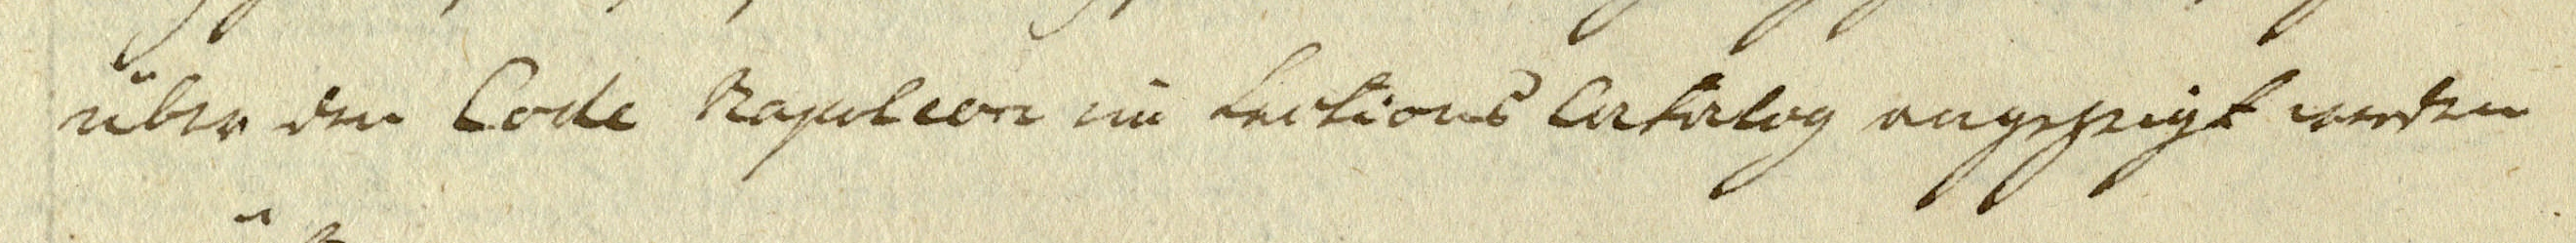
über den Code Napoleon im Lections Catalog angezeigt werden
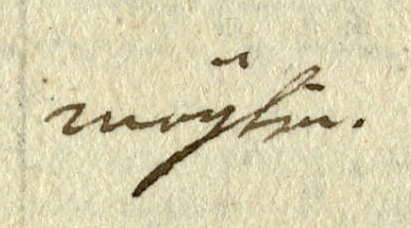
mögten.
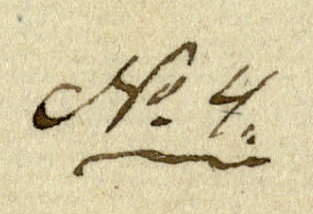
No 4.
